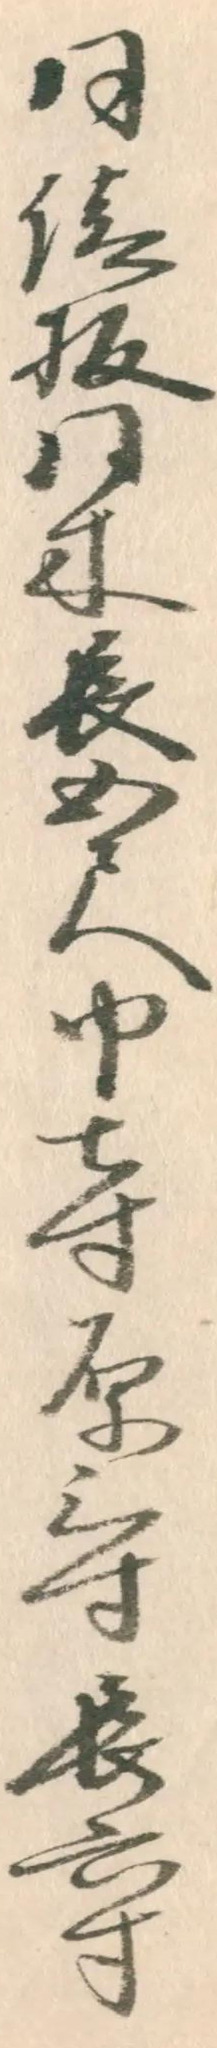同請板同木長五尺巾七寸厚三寸長六寸
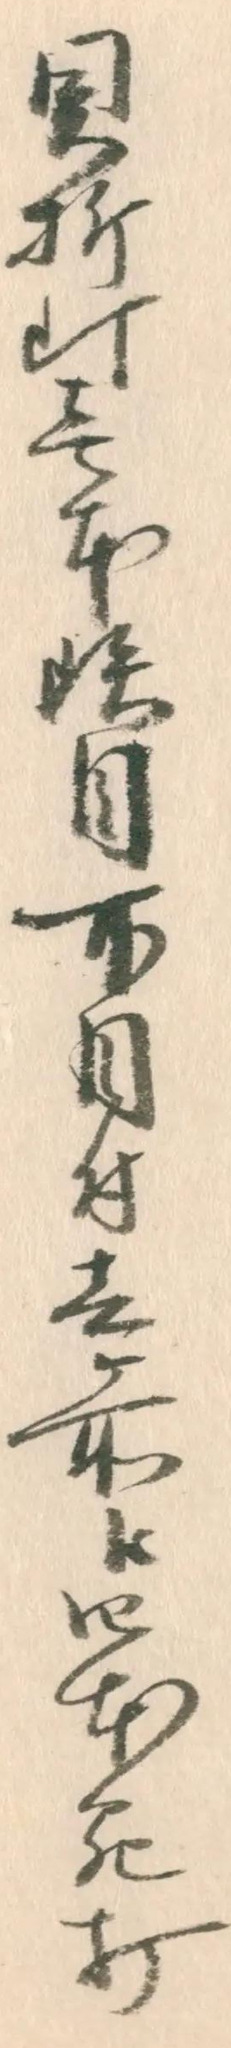貝折釘壱本鉄目廿目付壱ケ所え四本宛打
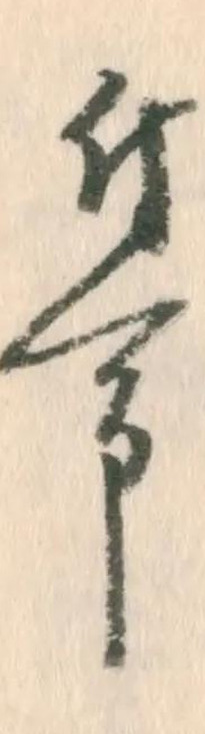付可申
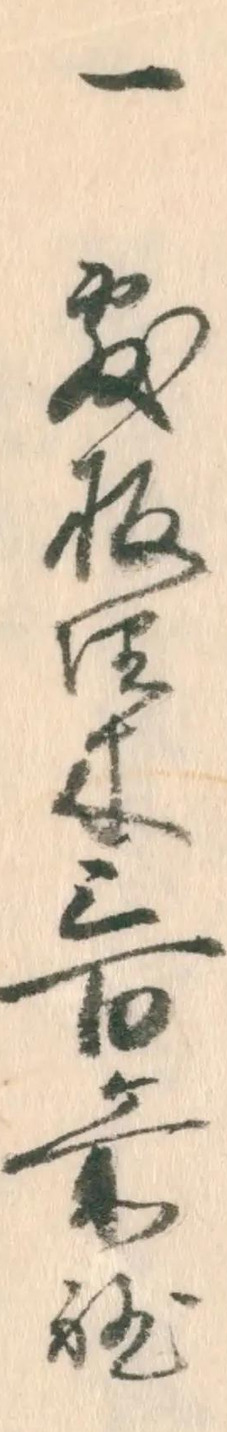一敷板埋木三百ケ所程
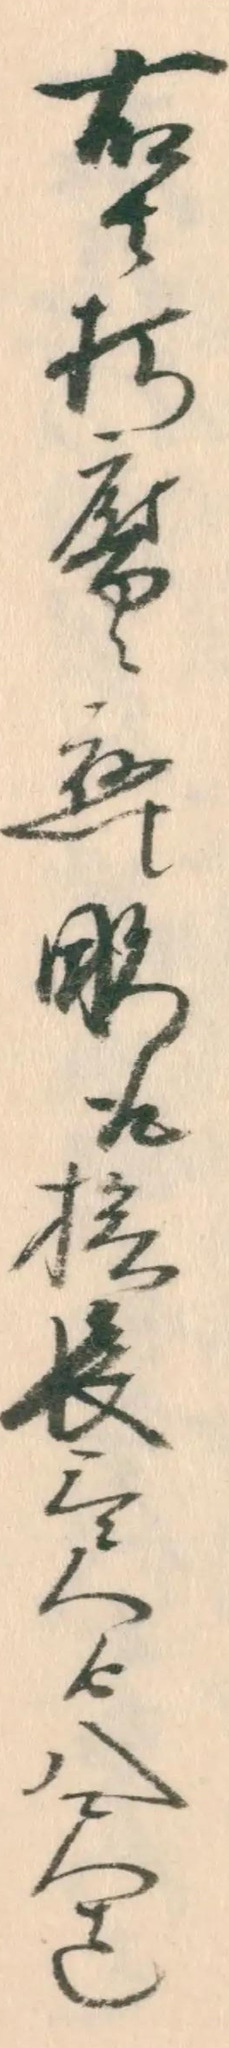右は朽腐ニ応し彫取桧長三尺ゟ八尺迄
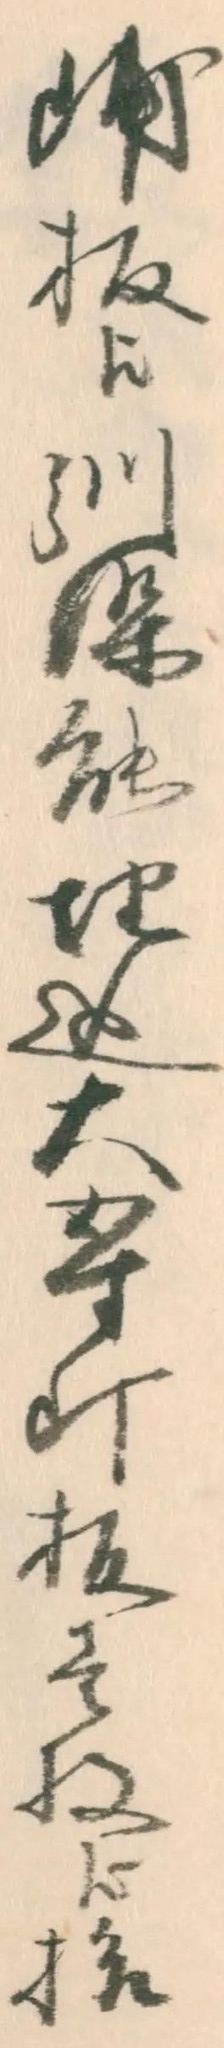鋪板え馴染能埋込大五寸釘板壱枚え拾
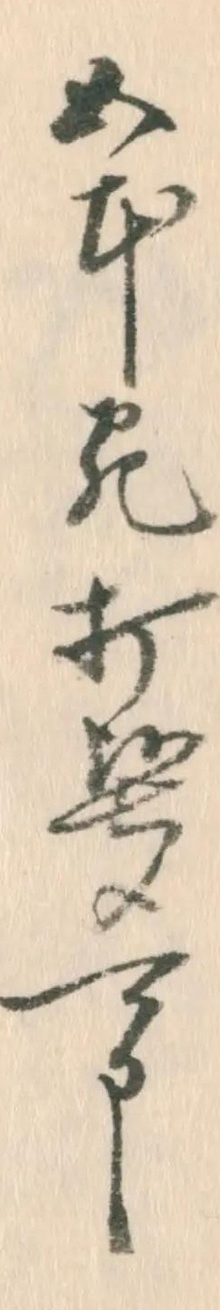五本宛打堅メ可申
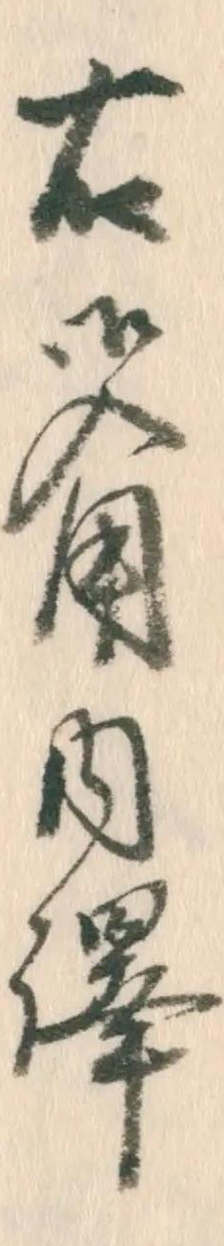右御入用内訳

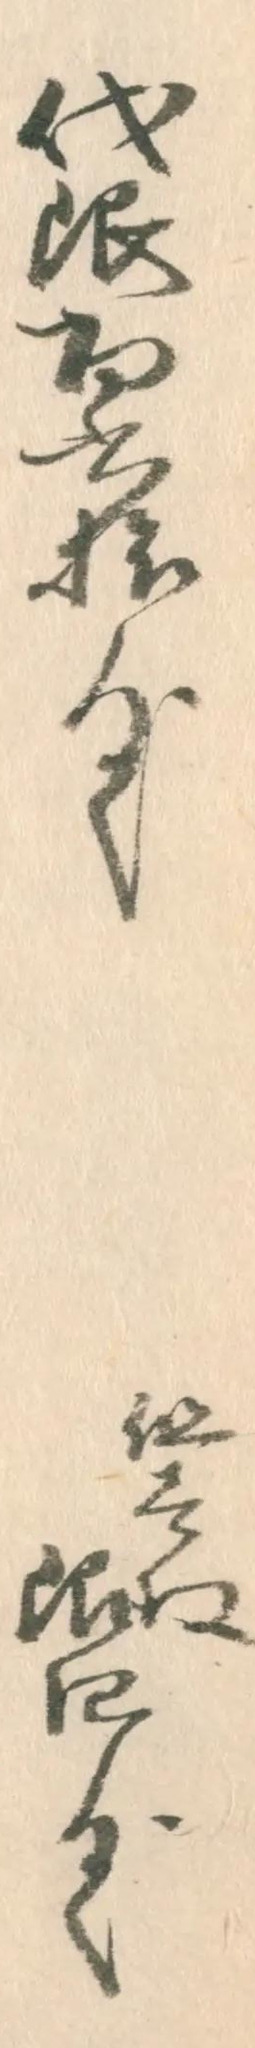代銀百六拾匁但壱枚銀四匁
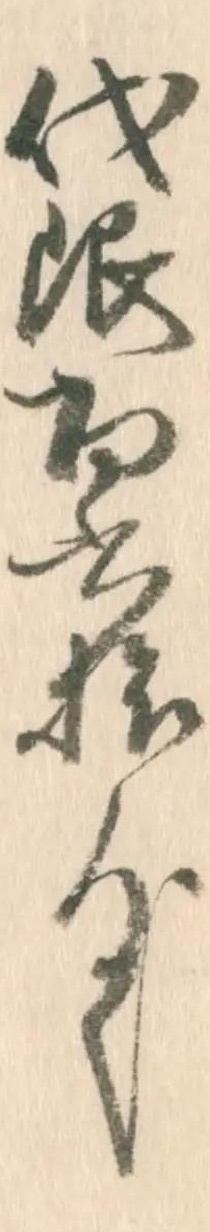代銀百六拾匁但壱枚銀四匁
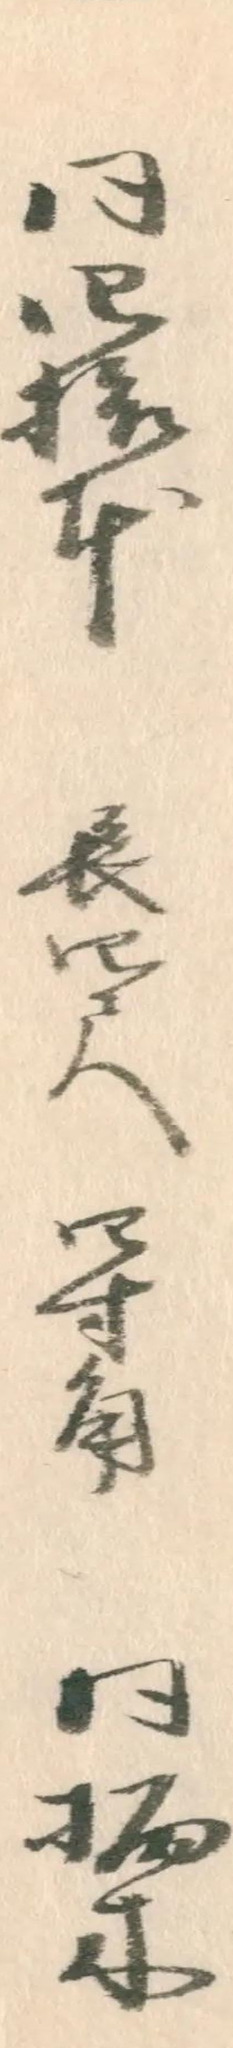一同四拾本長四尺四寸角同柄木
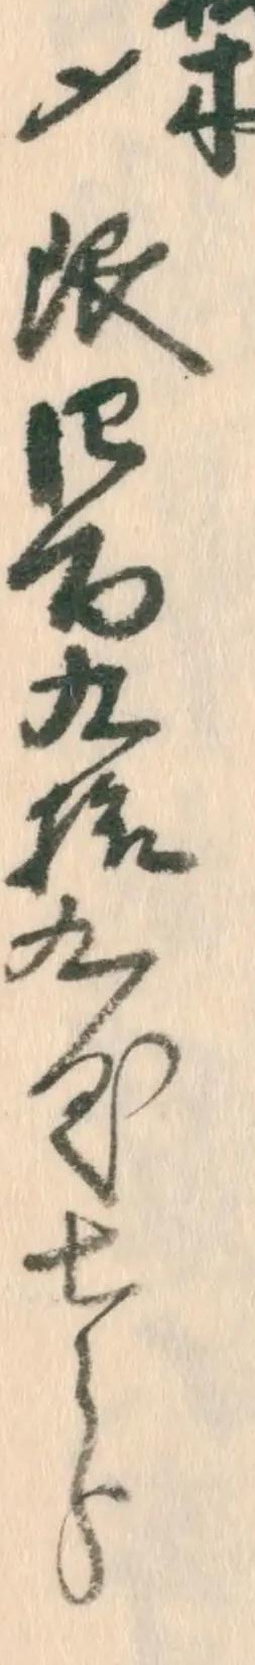〆銀四百九拾九匁七分
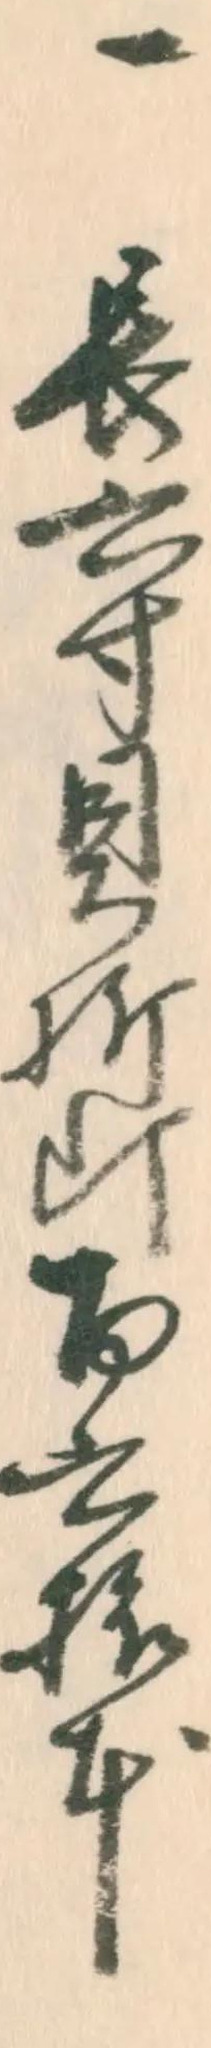一長六寸貝折釘百六拾本
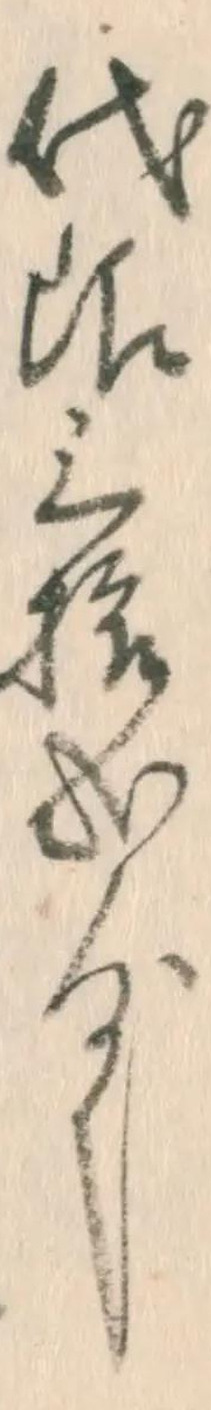代銀三拾弐匁但百本銀弐拾匁
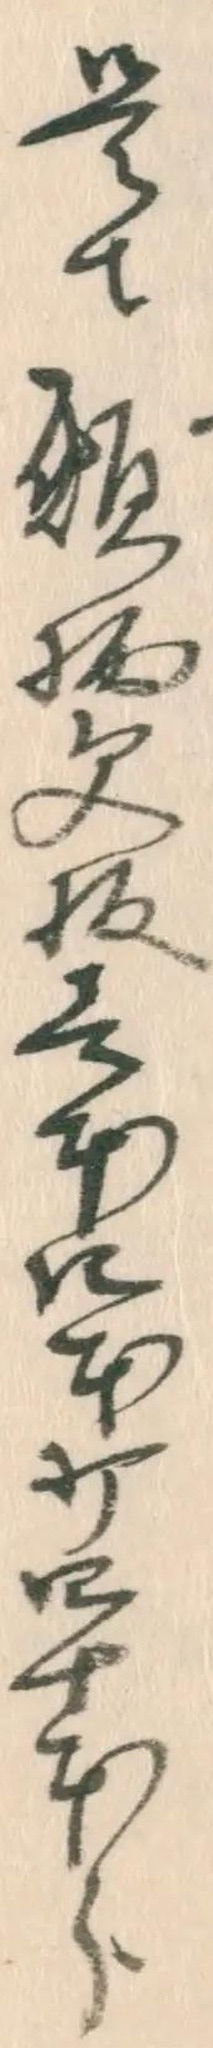是は頬柄受板壱本四本打四拾本分
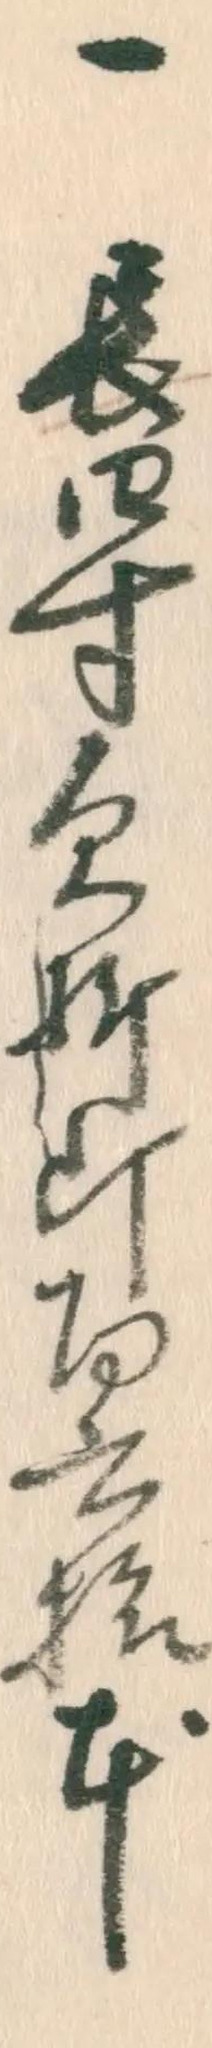一長四寸欠折釘百六拾本
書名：三橋 17巻. [7] 三橋小破御修復書留　但御奉行御掛リ替地震潰橋番屋　嘉永四亥年より安政二卯年迄　上
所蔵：国立国会図書館 National Diet Library, JAPAN
